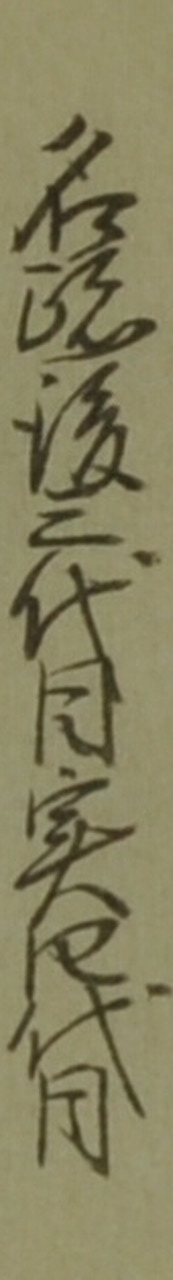名跡後三代目実四代目
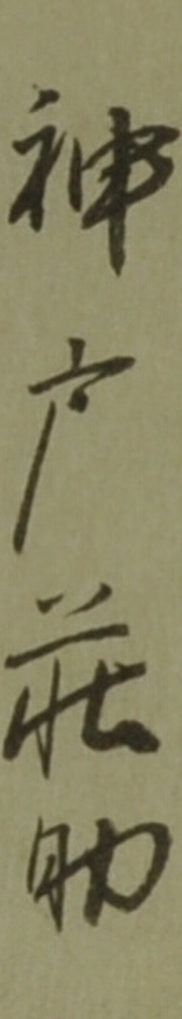神戸荘助
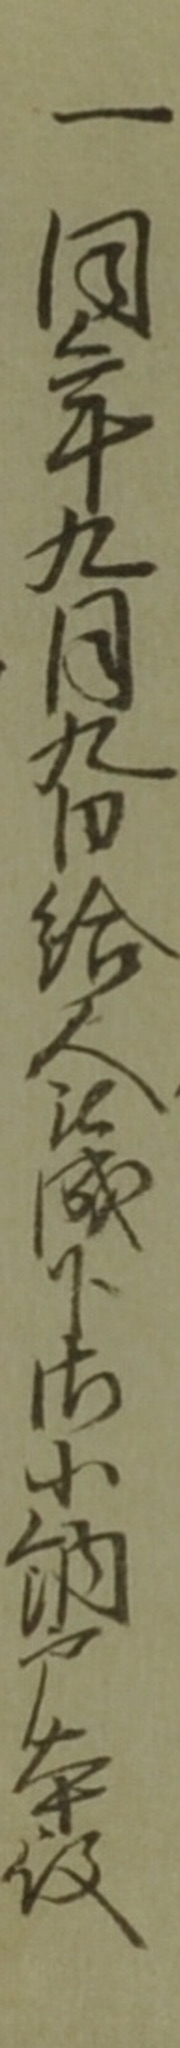一同年九月九日給人被成下御小納戸本役
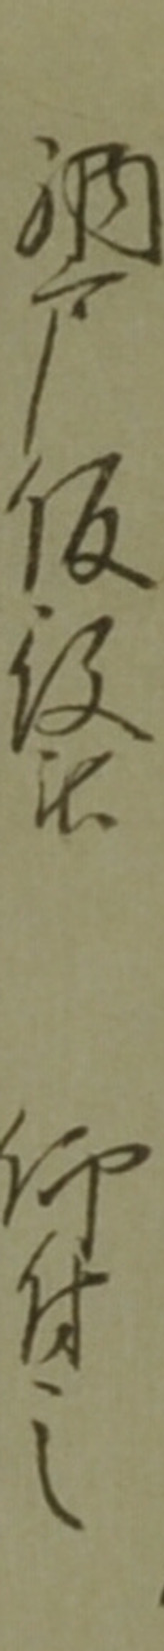納戸仮役被仰付之
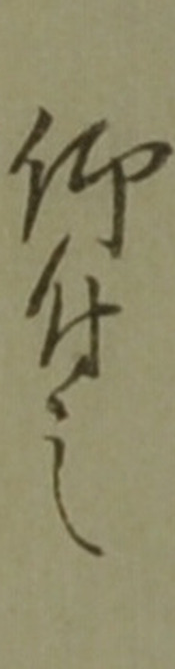仰付之
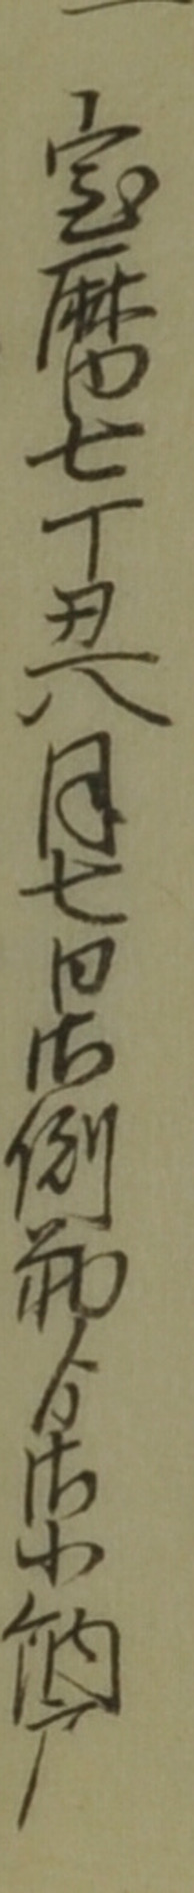一宝暦七丁丑八月七日御側勤ゟ御小納戸
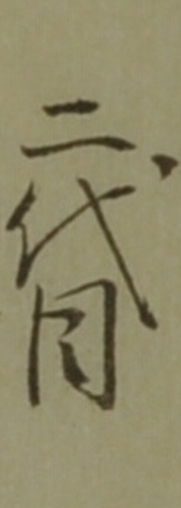二代目
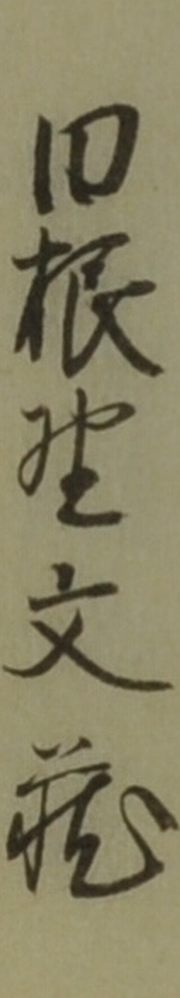日根野文蔵
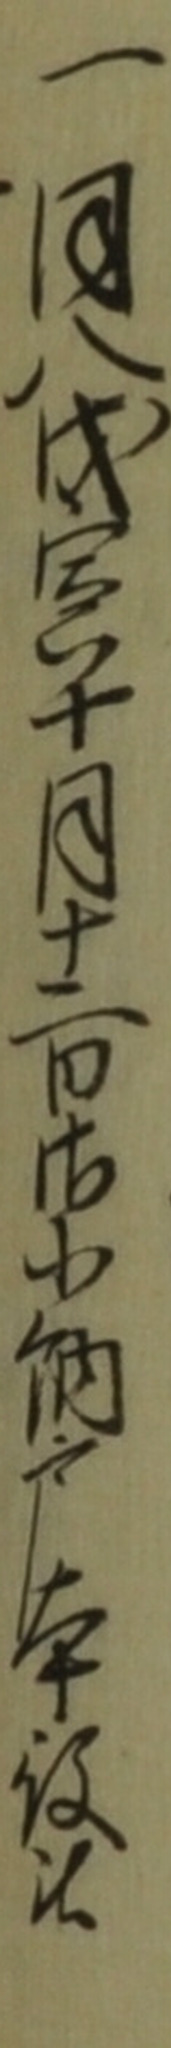御八戊寅十月十二日御小納戸本役被
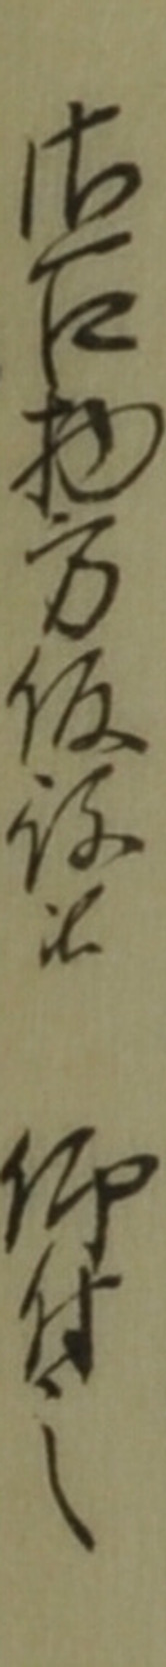御試役当分仮役被仰付之
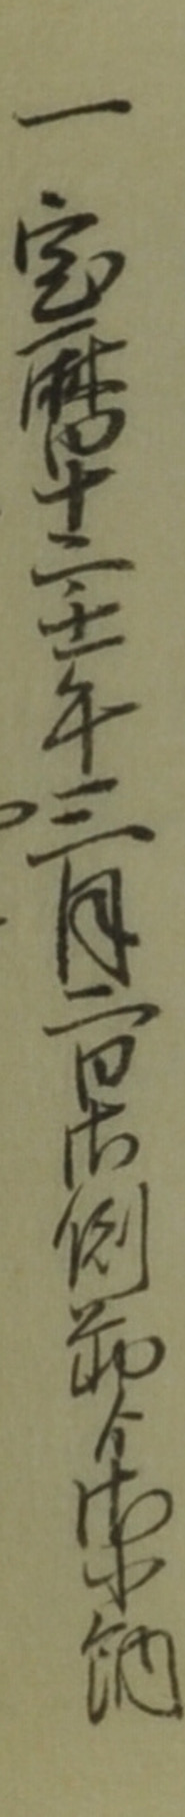一宝暦十二壬午三月二日御側勤ゟ御小納
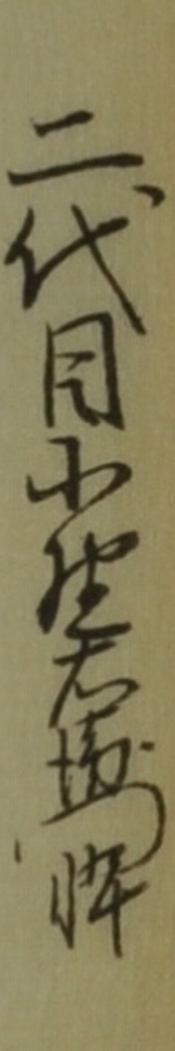二代目小野右衛門忰
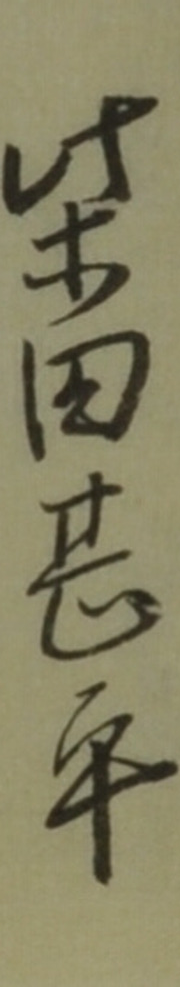柴田甚平
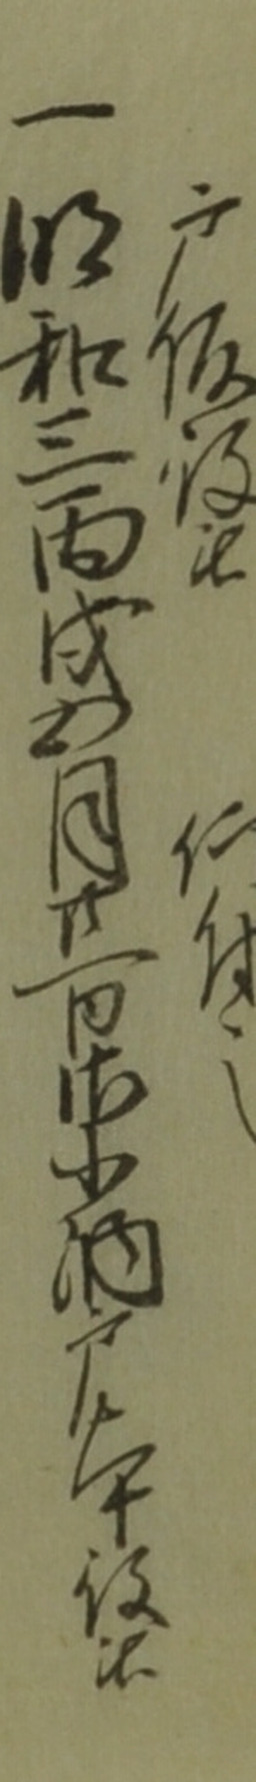一明和三丙戌五月廿一日御小納戸本役被
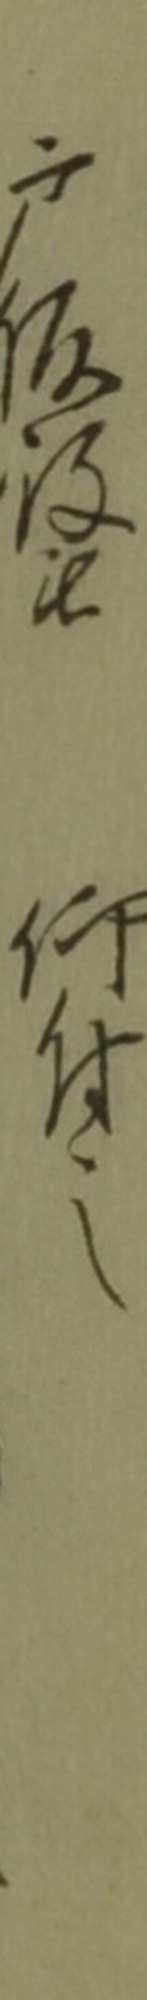納戸仮役被仰付之
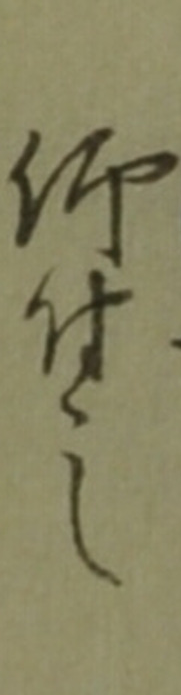仰付之
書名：諸御役代々録（四）
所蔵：伊那市立高遠町図書館・合同会社AMANE
